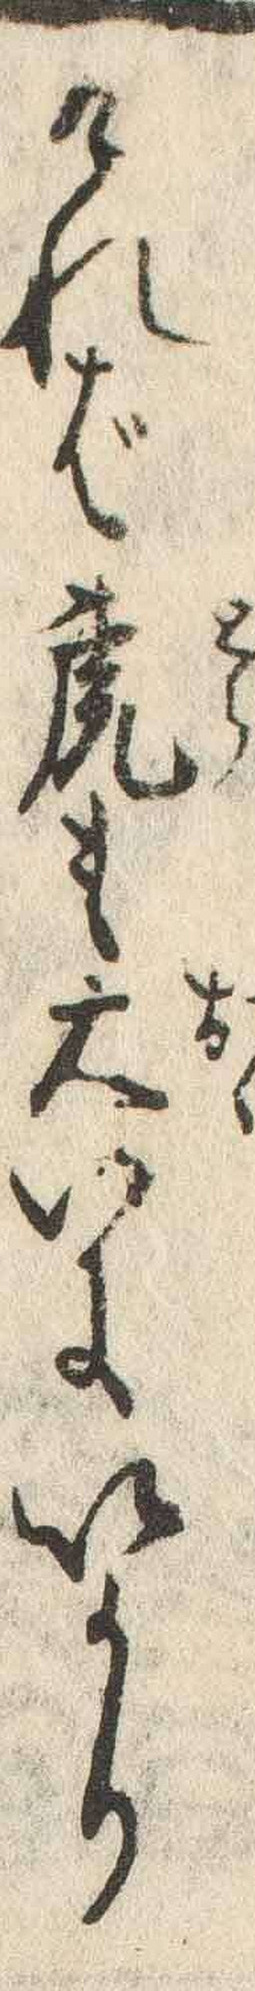ければ虎も大いにいかり
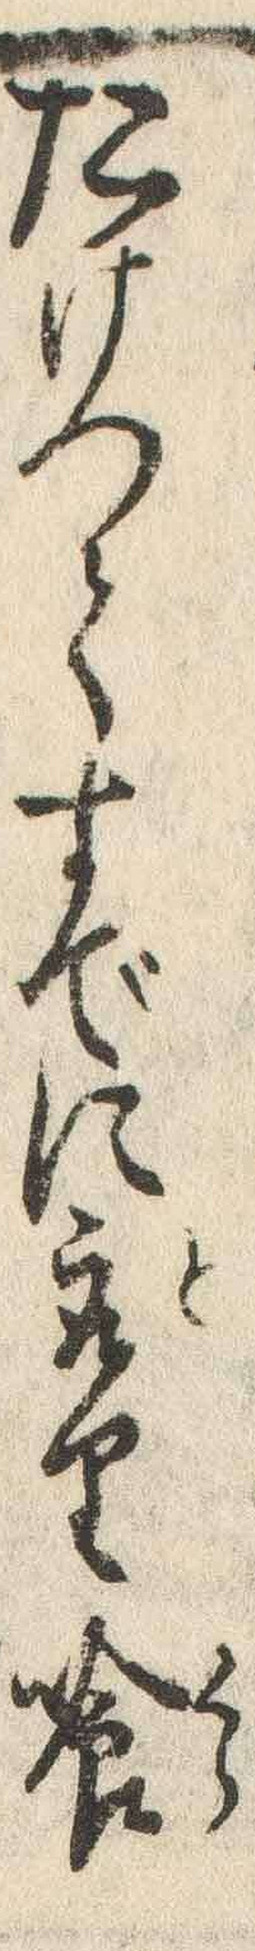たけつてすでに取り喰
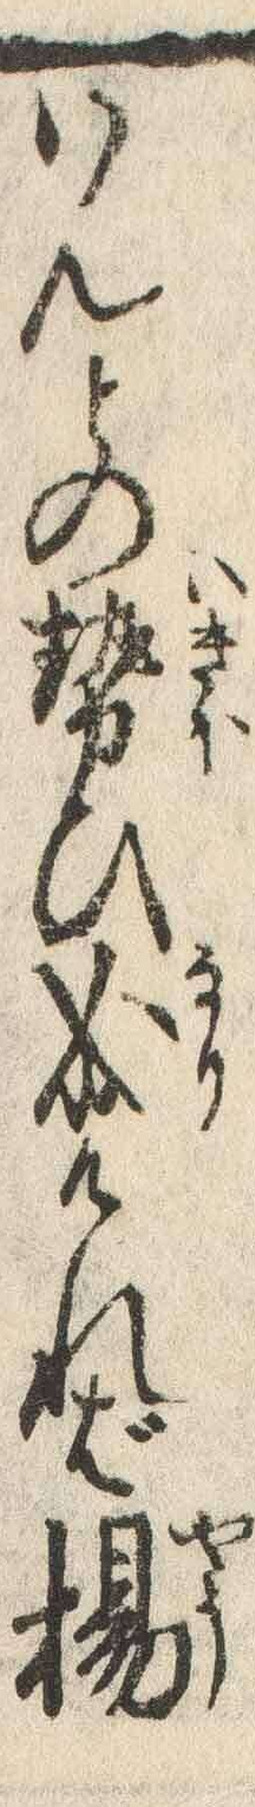はんとの勢ひ成ければ楊
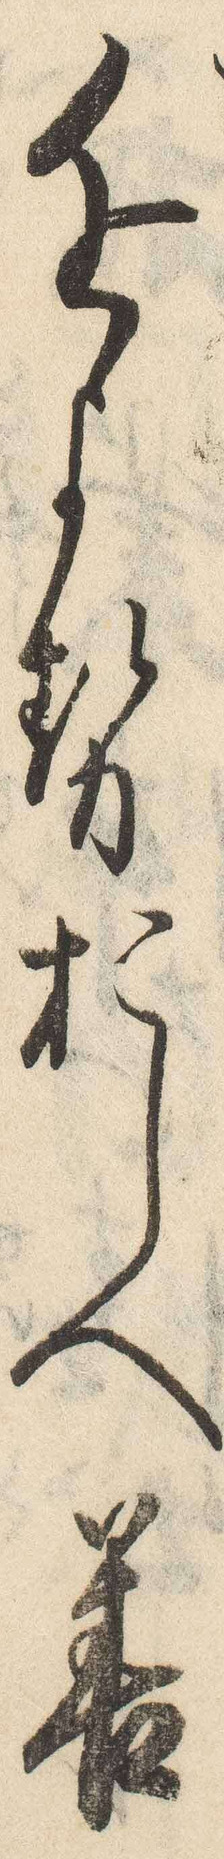近よせおしへ善
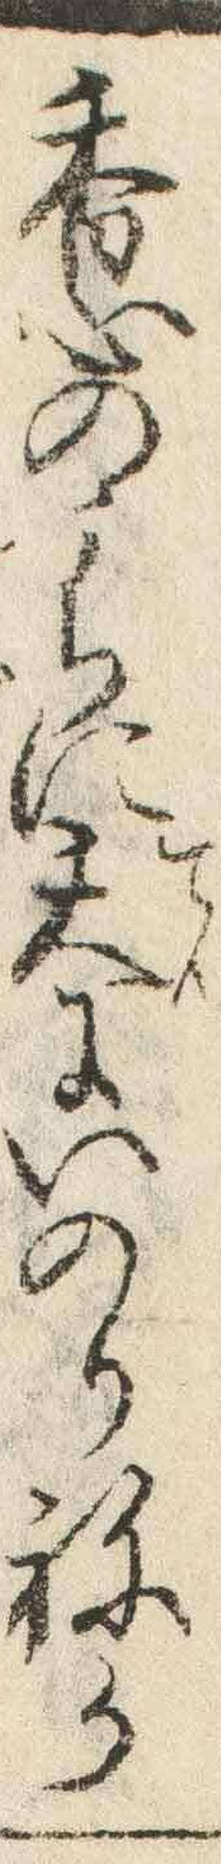香心のうちに天にいのりねか
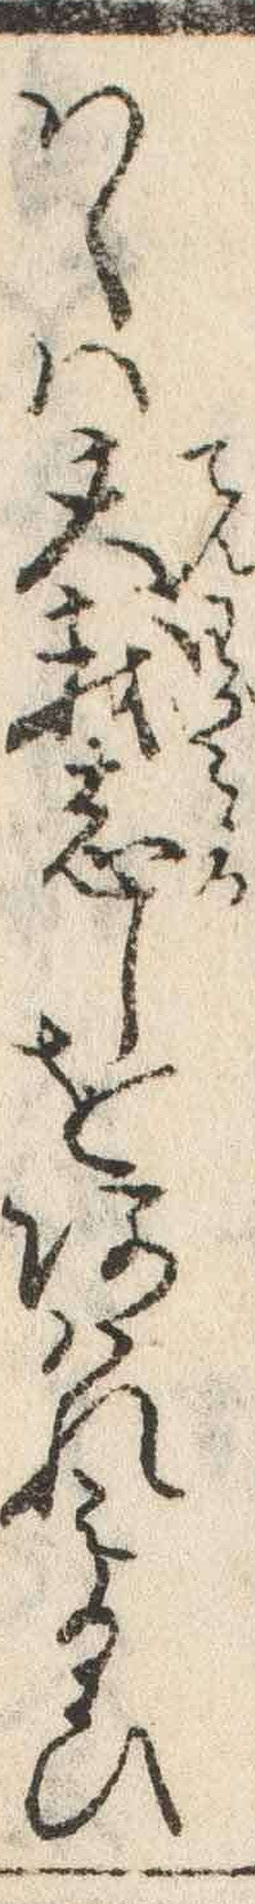はくは天我志しをあはれみ給ひ
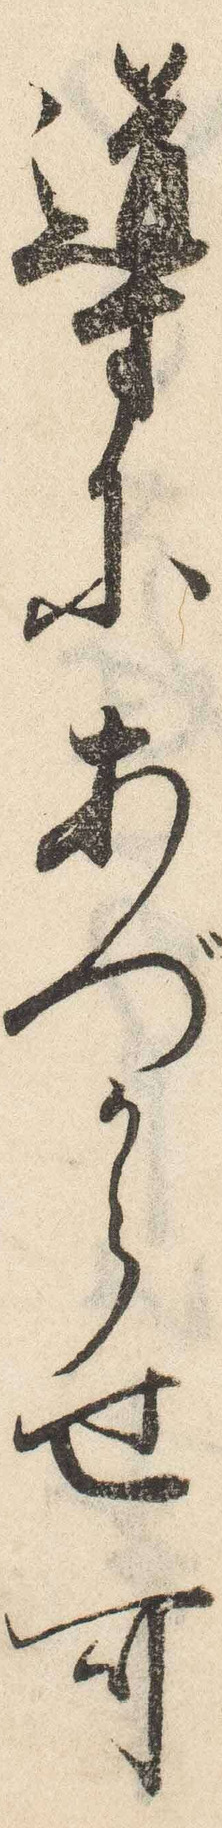導にあづからせ可
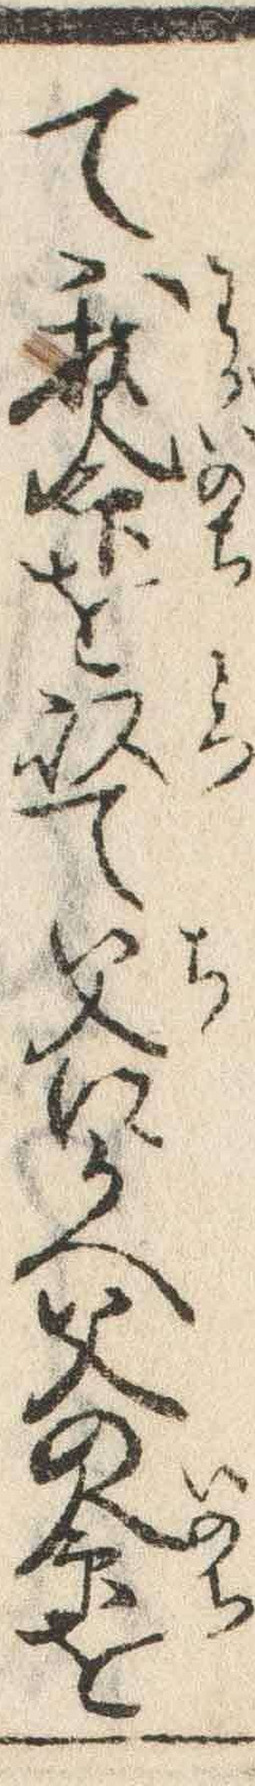て我命を以て父にかへ父の命を
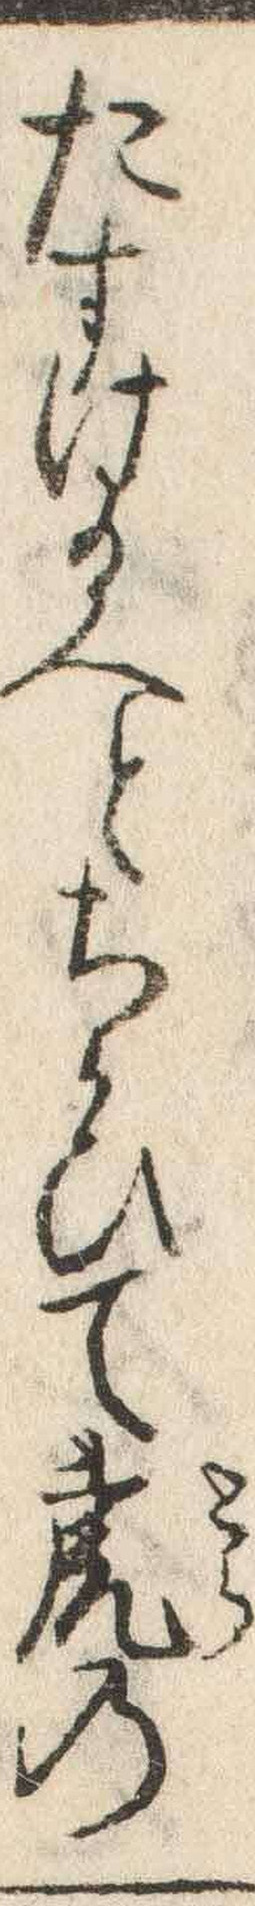たすけ給へとちかひて虎の
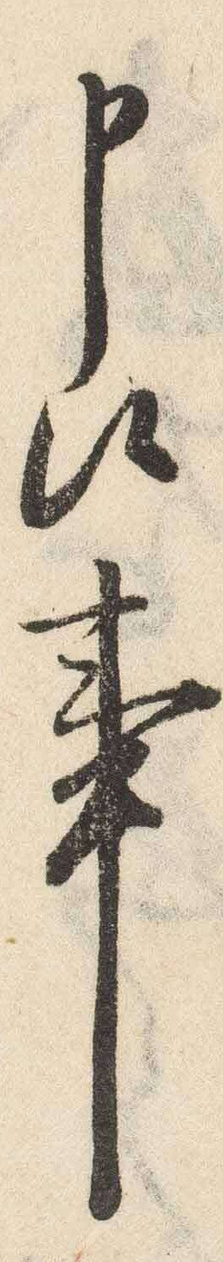申候事
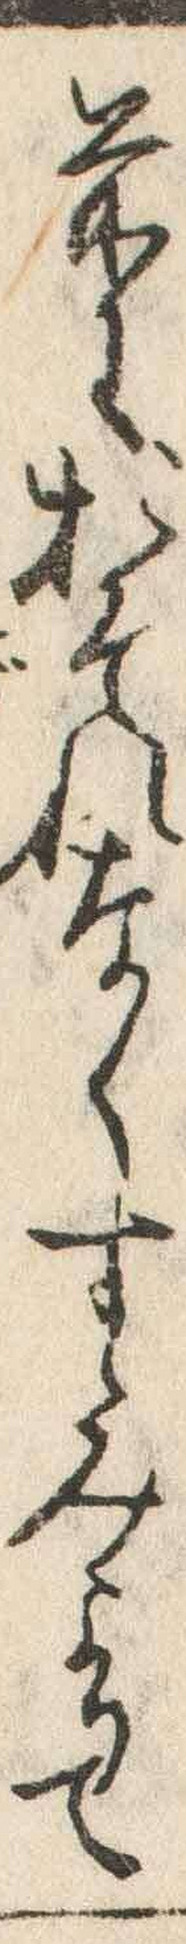前におそれなくすゝみよりて
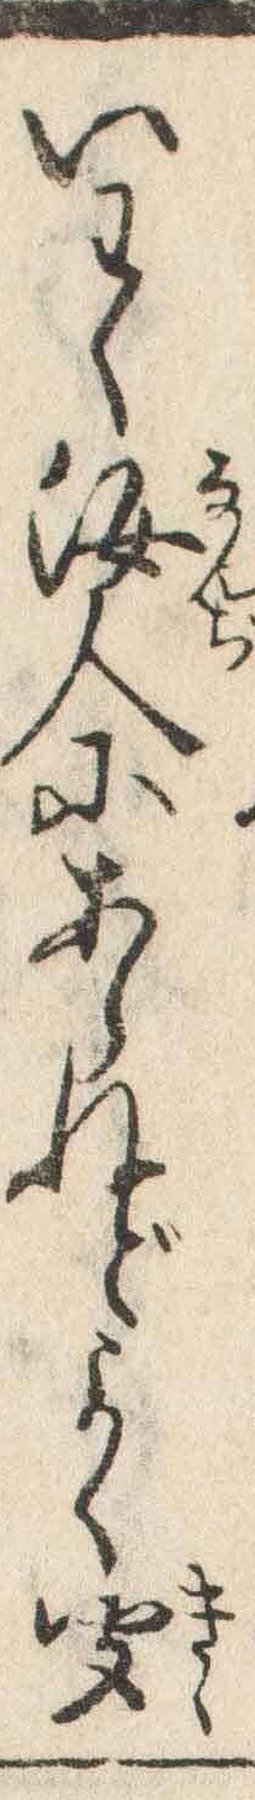いわく汝人にあらねどよく聞
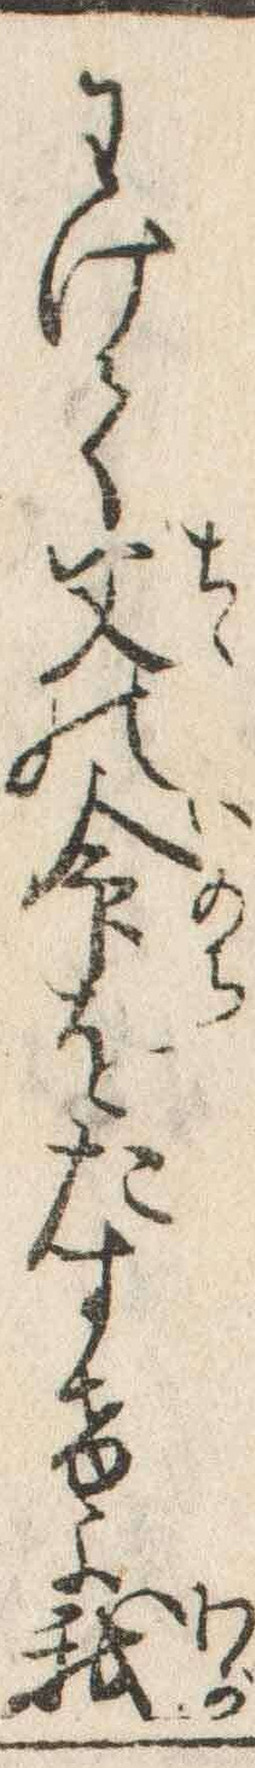わけて父の命をたすけよ我
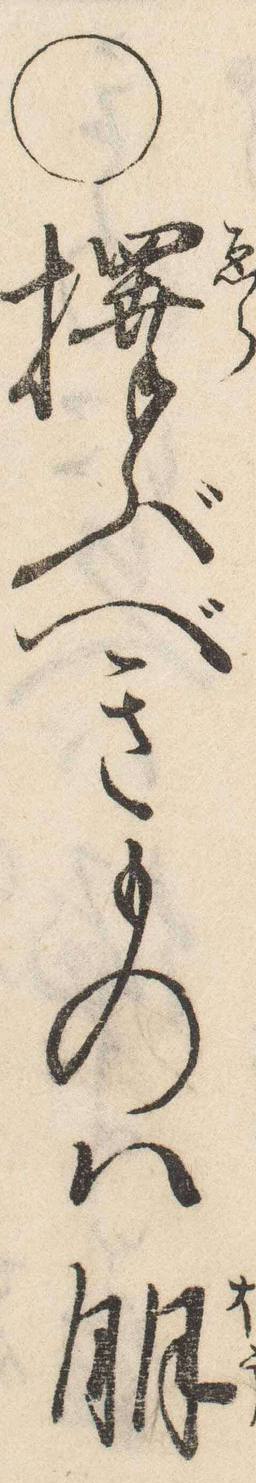〇択ぶべきものは朋
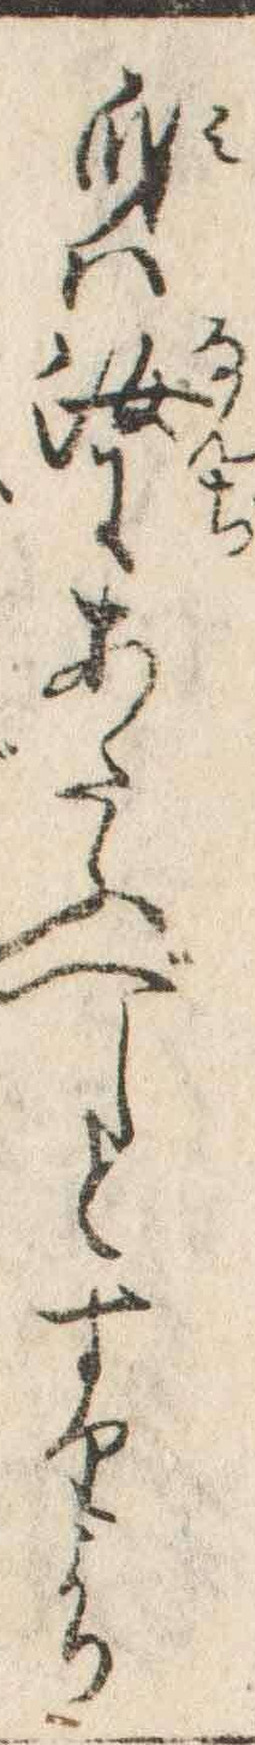身は汝にあたふべしとすりより
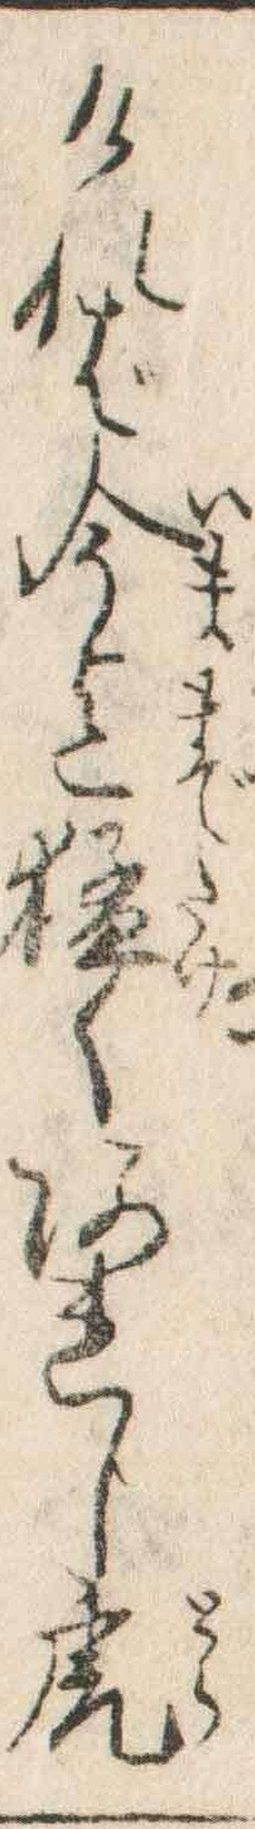ければ今迄猛くあれし虎
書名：撫育草
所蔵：東京学芸大学附属図書館 国文学研究資料館
